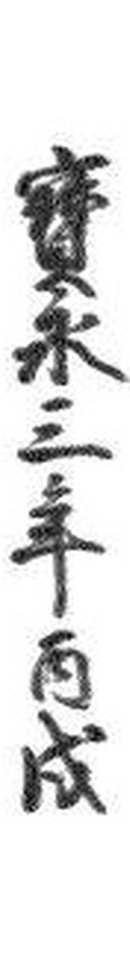宝永三年丙戌
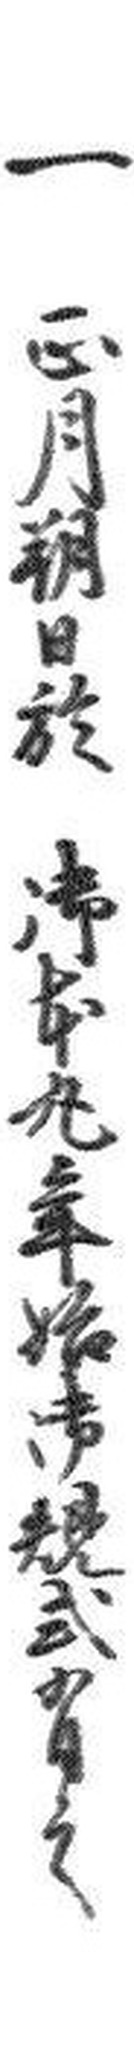一正月朔日於御本丸年始御規式有之
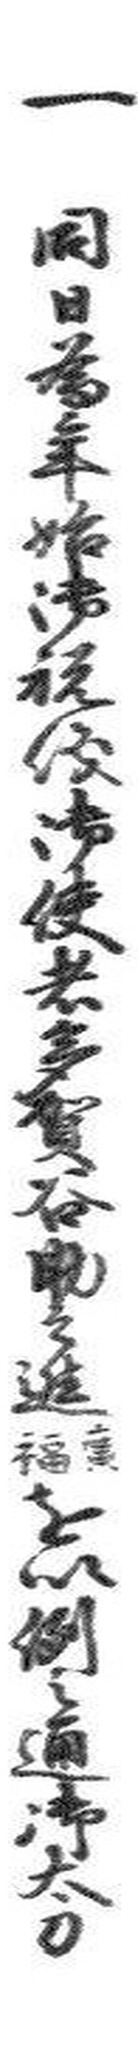一同日為年始御祝儀御使者多賀谷助之進広福を以例之通御太刀
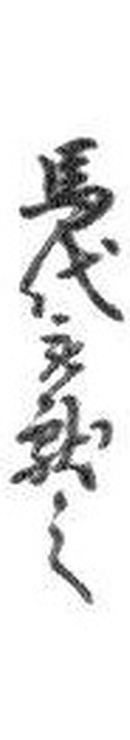馬代被献之
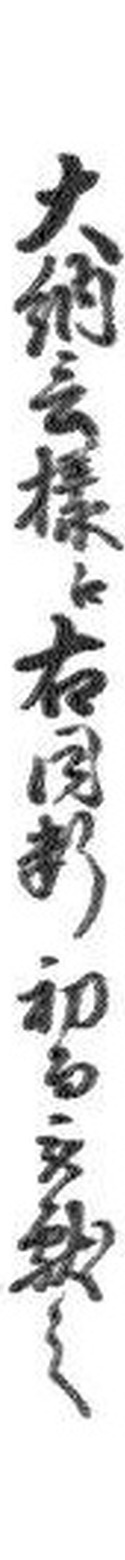大納言様江右同断初而被献之
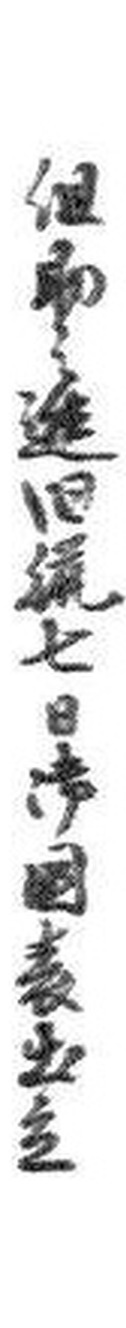但助之進旧臘七日御国表出立
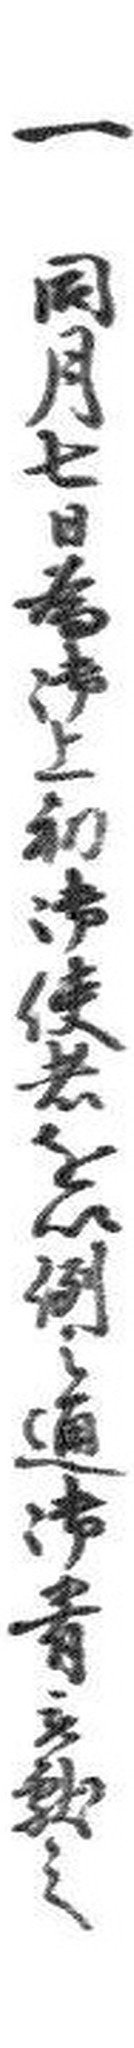一同月七日為御上初御使者を以例之通御肴被献之

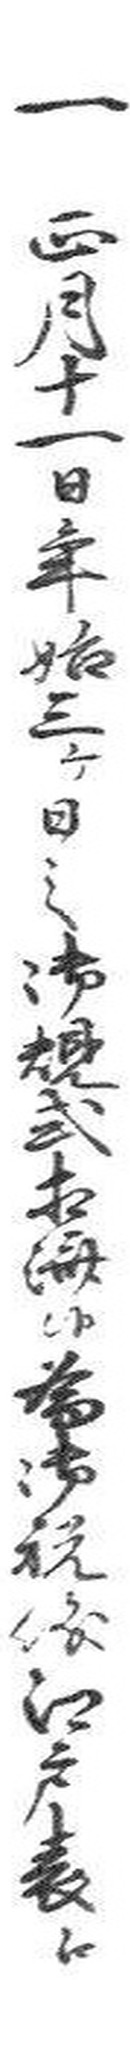一正月十一日年始三ヶ日之御規式相済候為御祝儀江戸表江
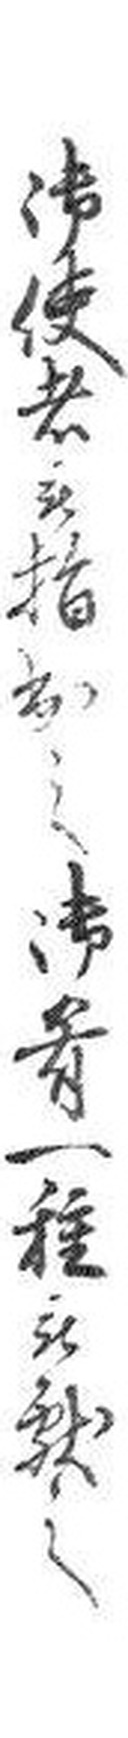御使者被指出之御肴一種被献之
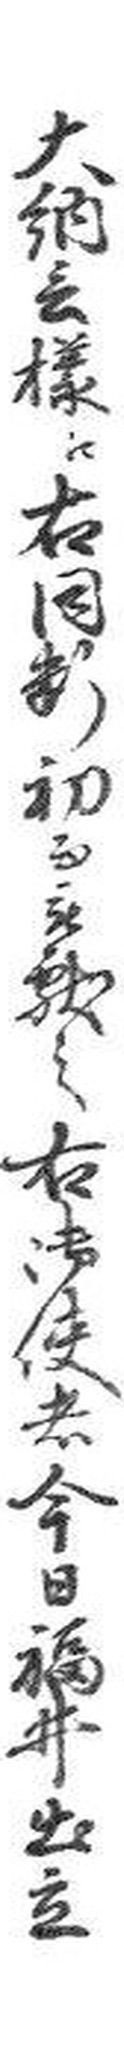大納言様江右同断初而被献之右御使者今日福井出立
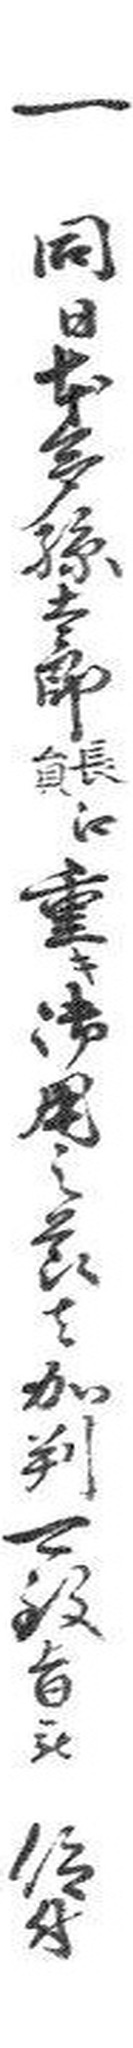一同日本多孫太郎長員江重キ御用之節者加判可致旨被仰付
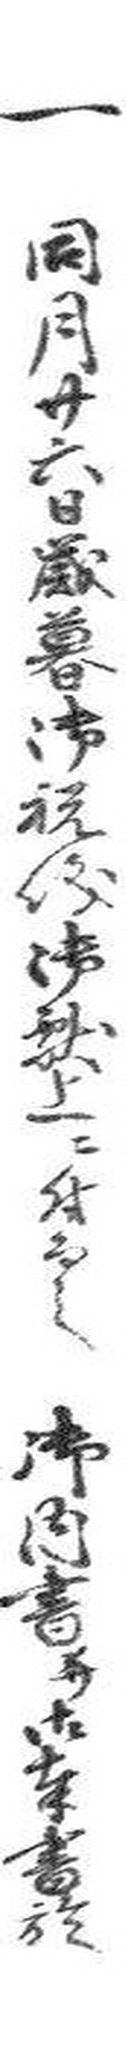一同月廿六日歳暮御祝儀御献上ニ付而之御内書并御奉書於
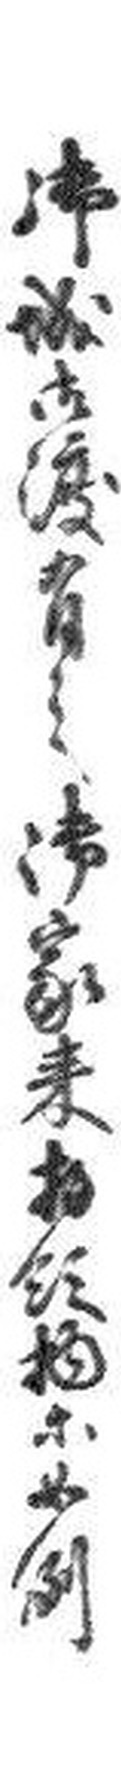御城御渡有之御家来拝領物等如例
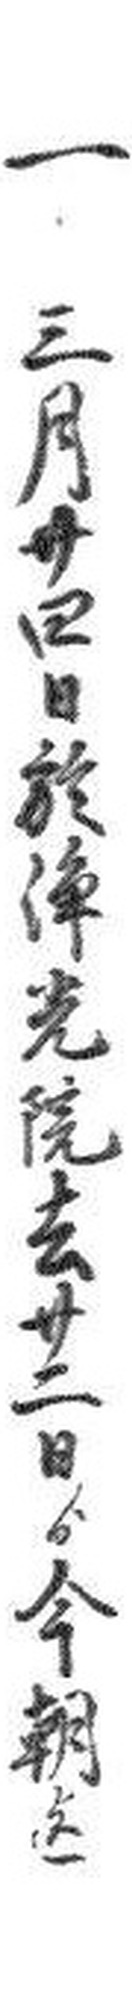一三月廿四日於浄光院去廿二日ゟ今朝迄
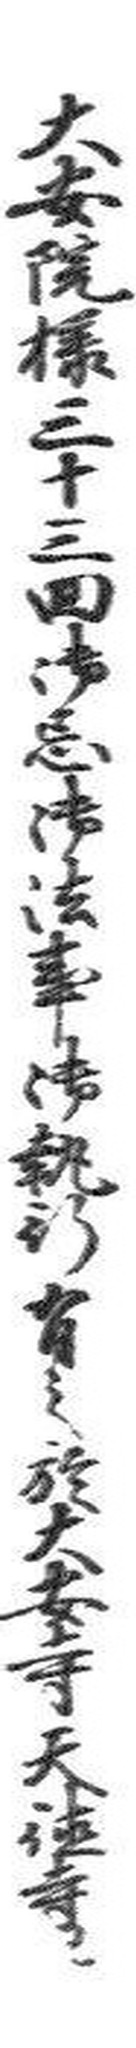大安院様三十三回御忌御法事御執行有之於大安寺天徳寺も
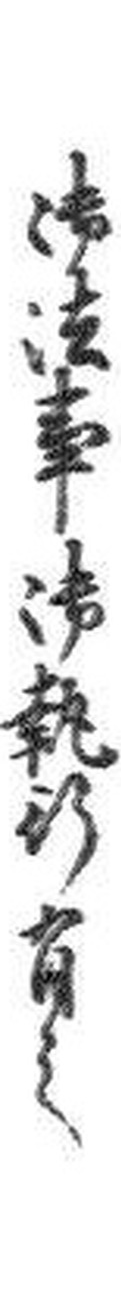御法事御執行有之
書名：家譜 二十四 吉品公 従宝永三年到同五年
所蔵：福井県文書館 Fukui Prefectural Archives
